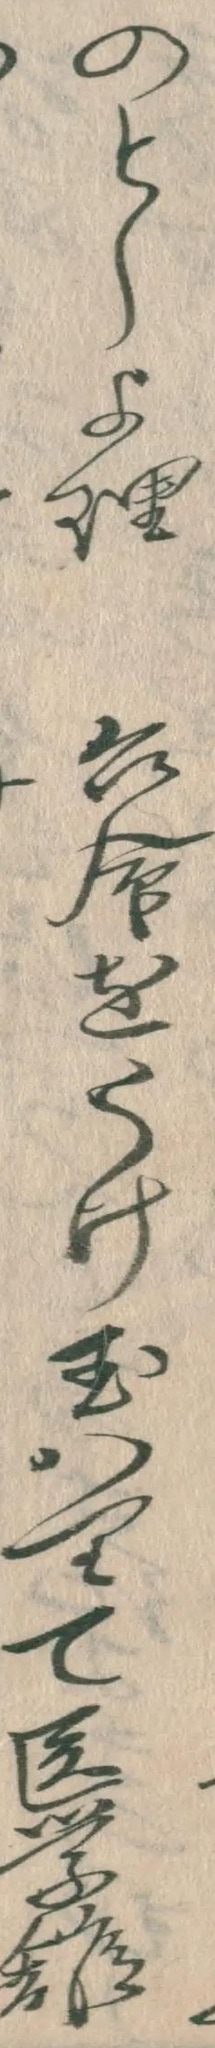のとしより台命をうけ玉はりて医学館
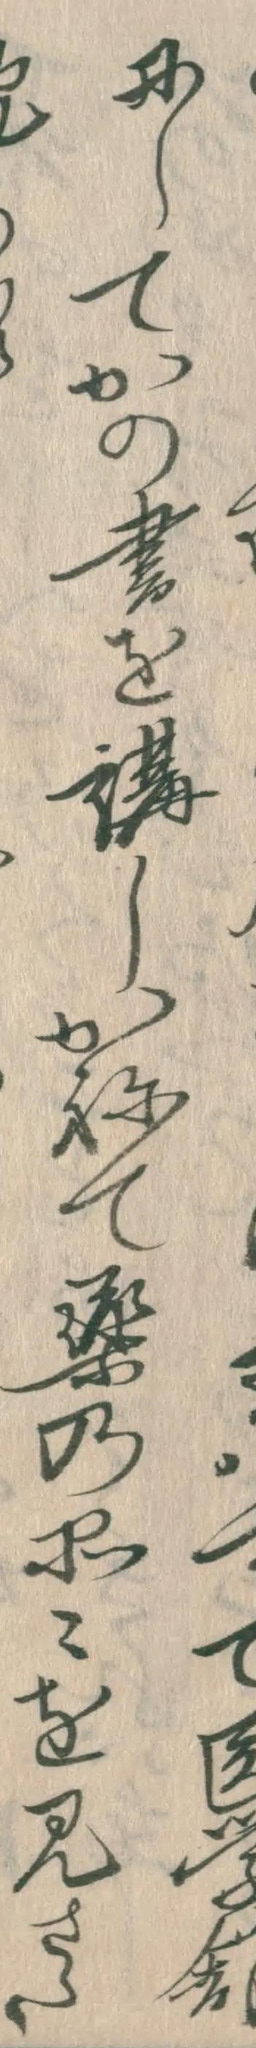にしてかの書を講しかねて薬の品々を見さた
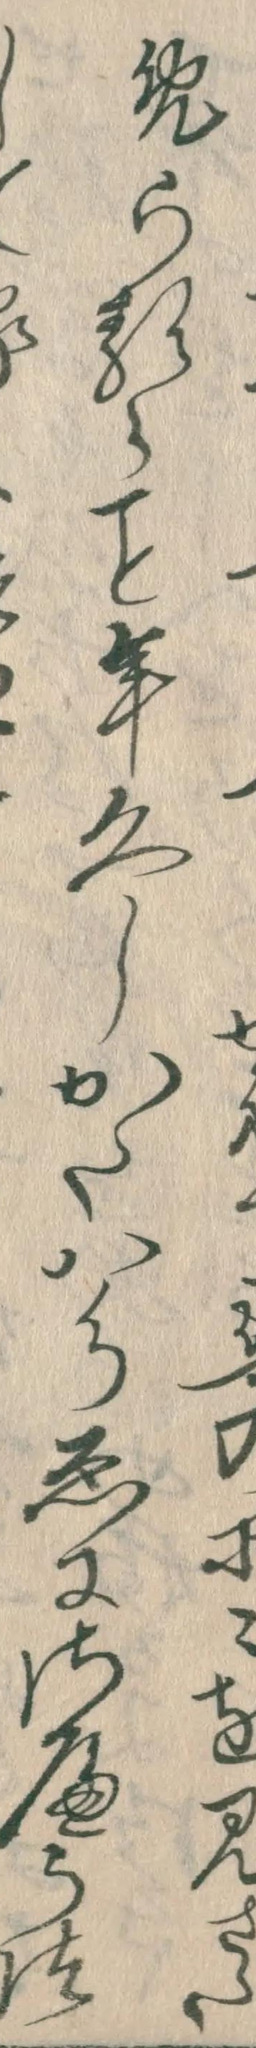めらるゝこと年久しかたはらゑにさへうつ
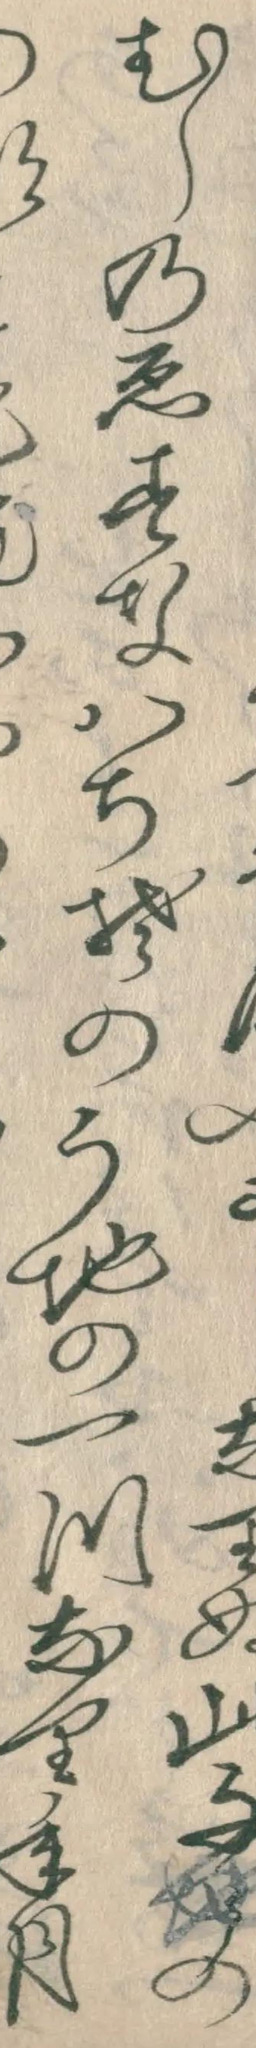むしのゑすなはちそのうちの一つなり年月
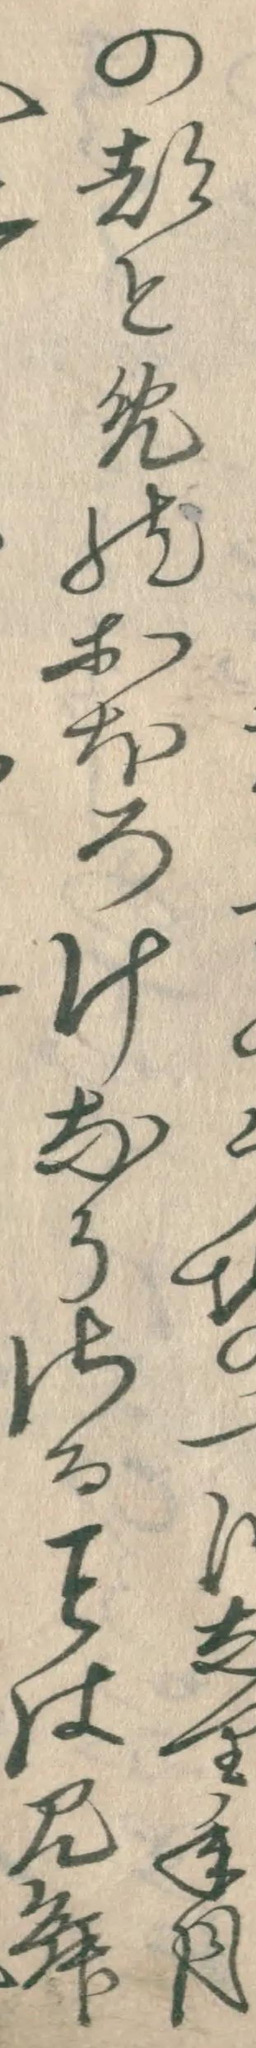のつとめのおほろけならさることは見舞
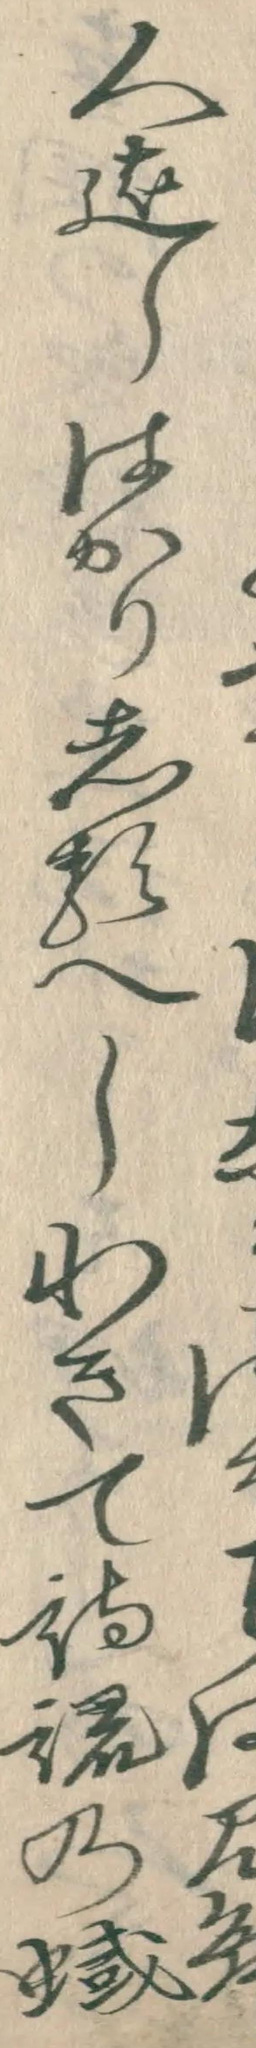人をしはかりしるへしわきて詩疏の蜮

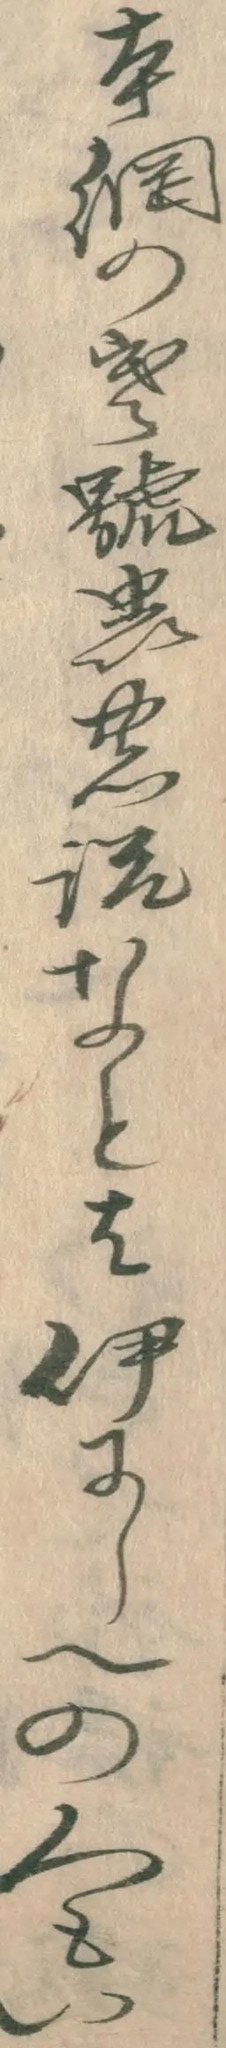本綱の寒號蟲の説なとはいにしへの人もい
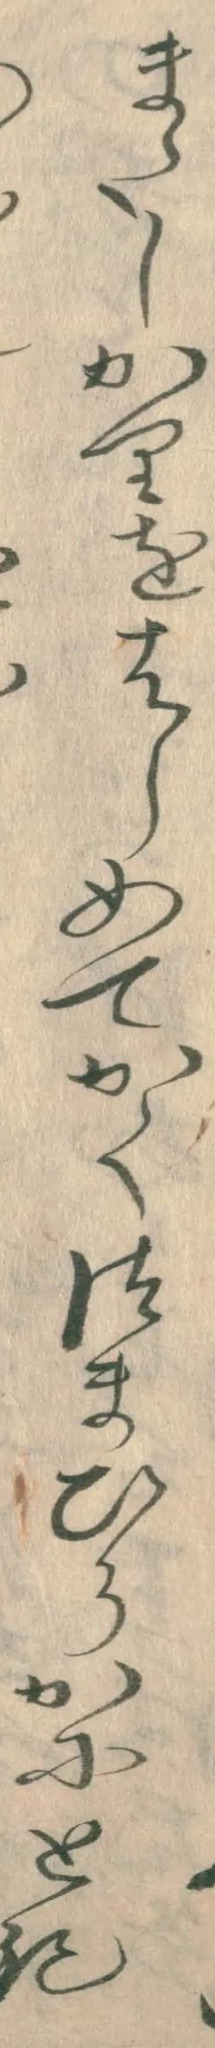またしかりをはしめてかくつまひらかにとき
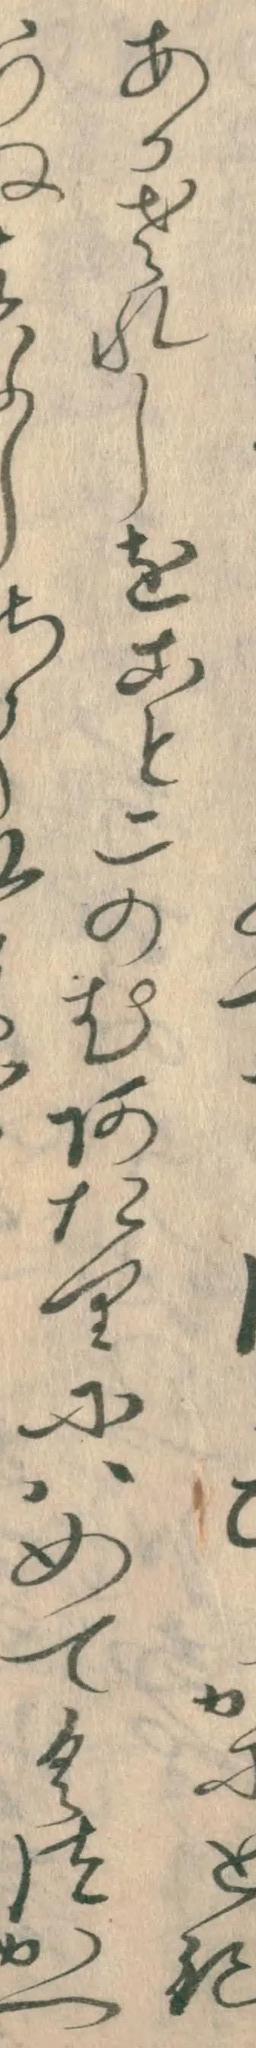あかされしをことこのむあたりにはめてくつかへ
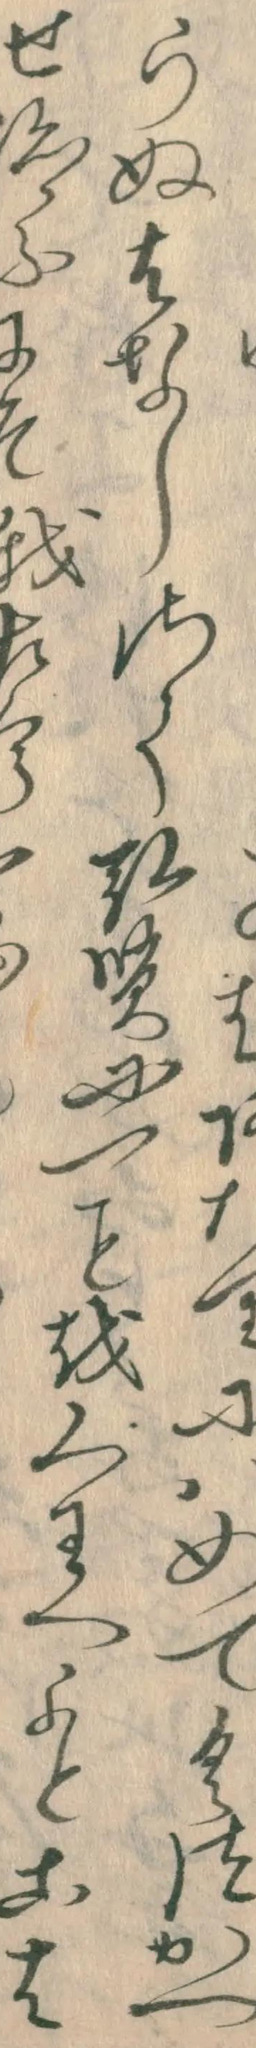らぬはなしさて弘賢に一ことをくはへよとこは
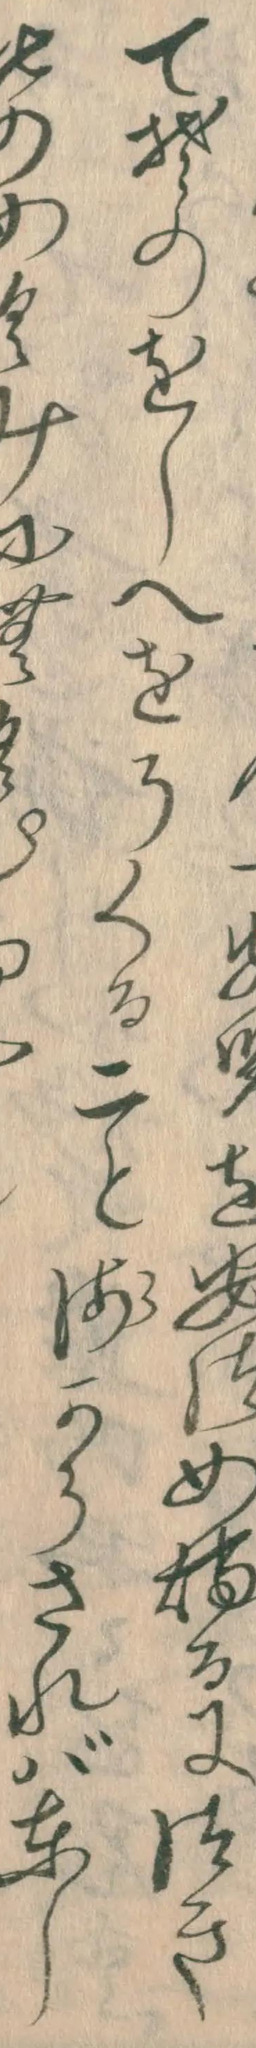てそのをしへをうくること浅からさればとし
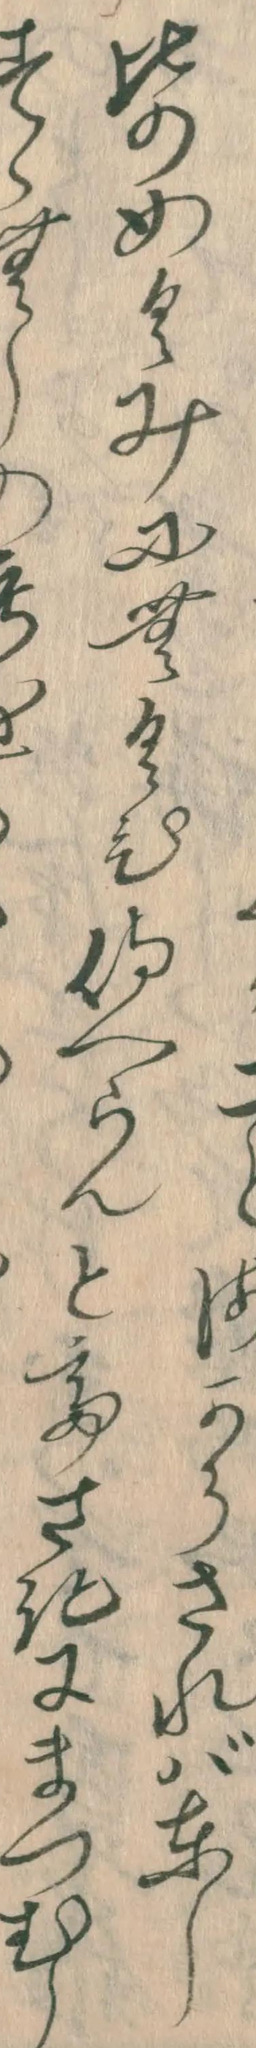比のめくみにむくひ侍へらんとてさきにまつむし
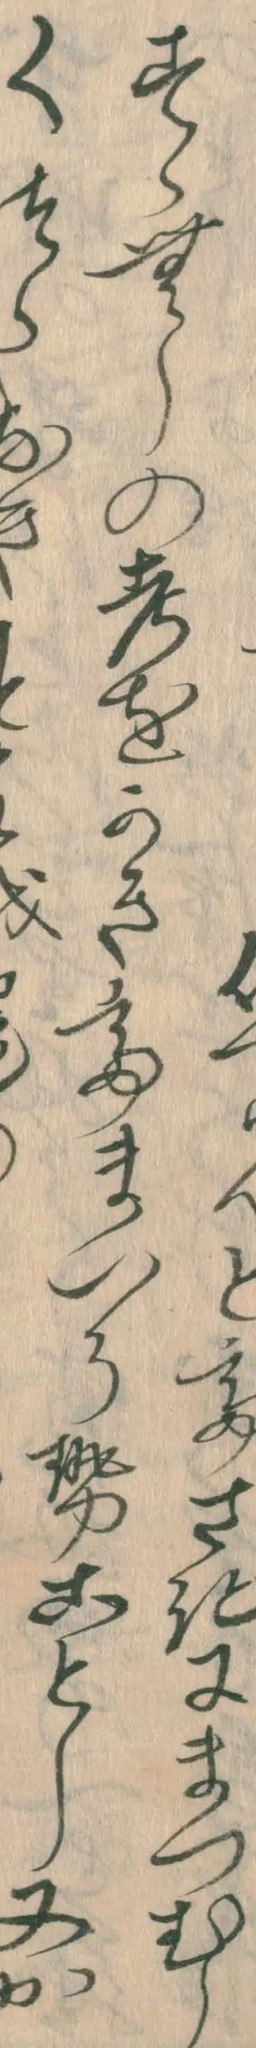すゝむしの考をかきてまいらせことし又か
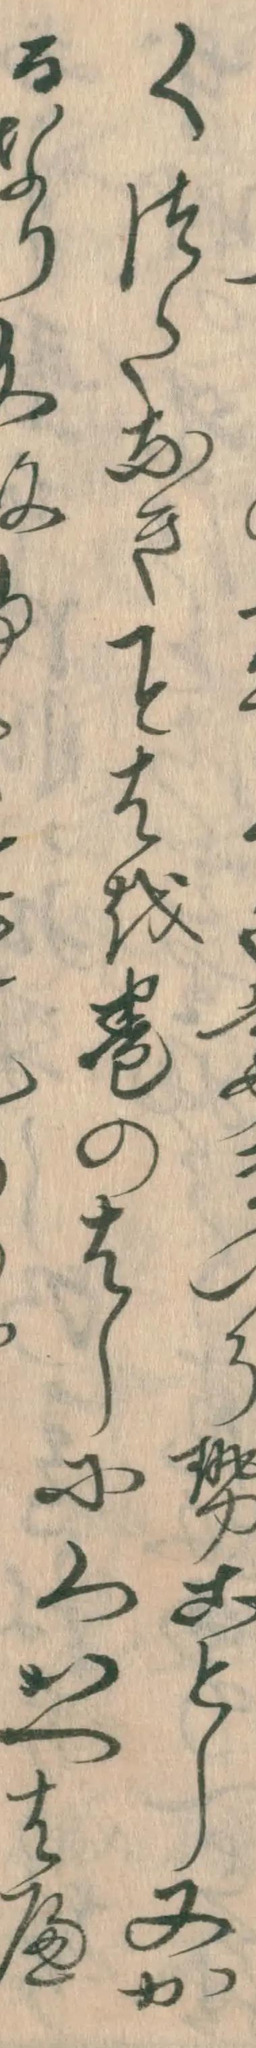くさつたなきことはを巻のはしにくはへはへ
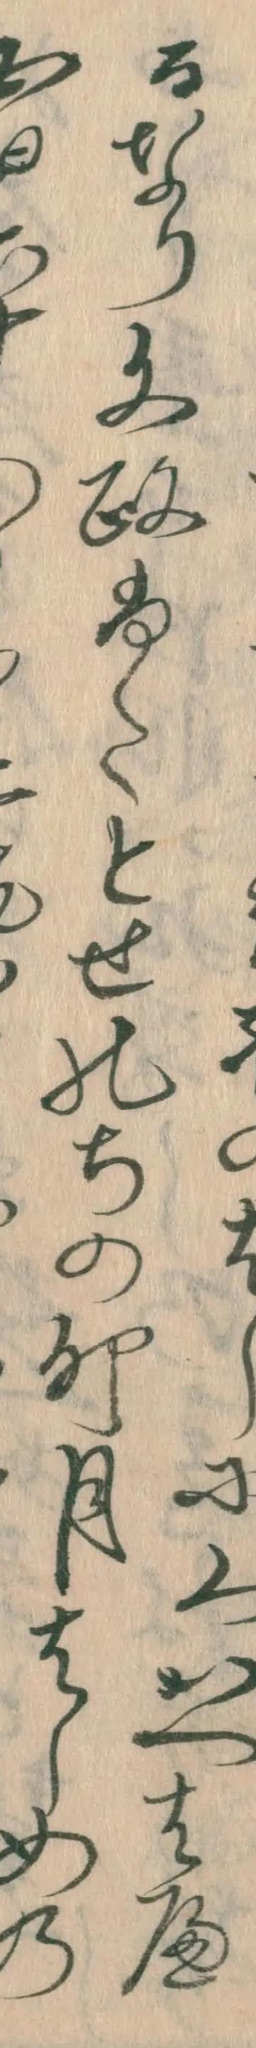るなり文政ふたとせのちの卯月はしめの
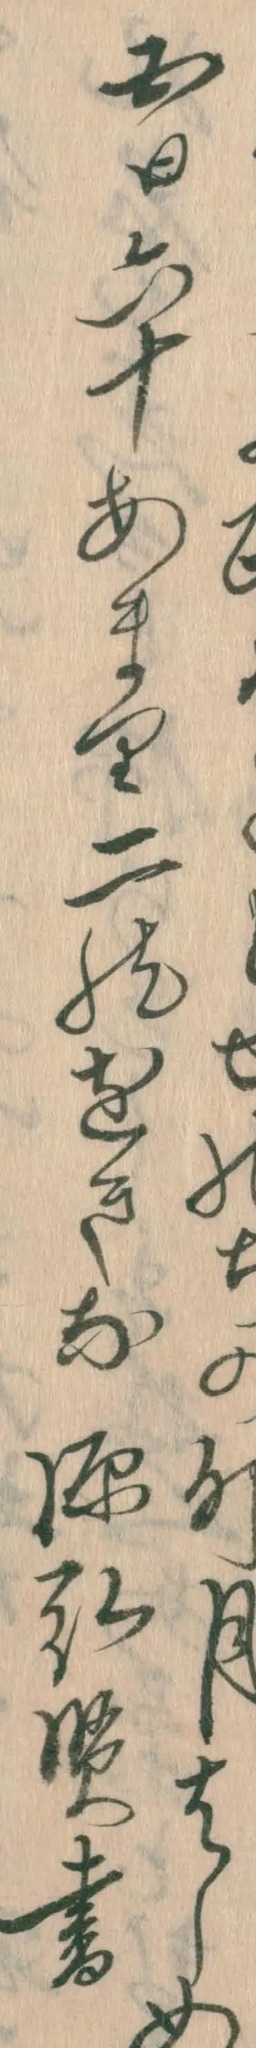五日六十あまり二のをきな源弘賢書
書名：千蟲譜 3巻. [1]
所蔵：国立国会図書館 National Diet Library, JAPAN
